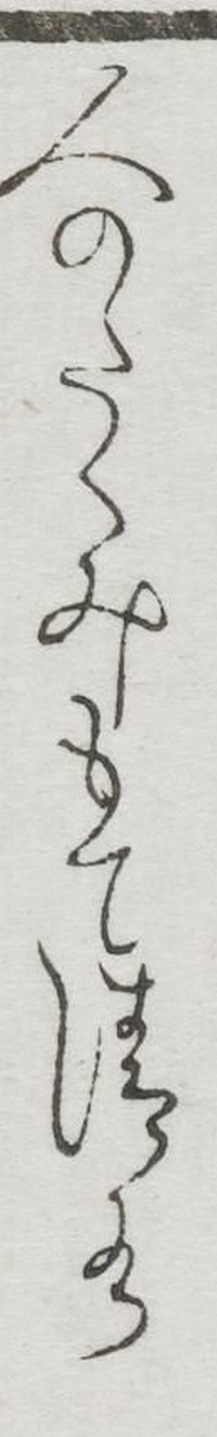人のたくみもて清水泉
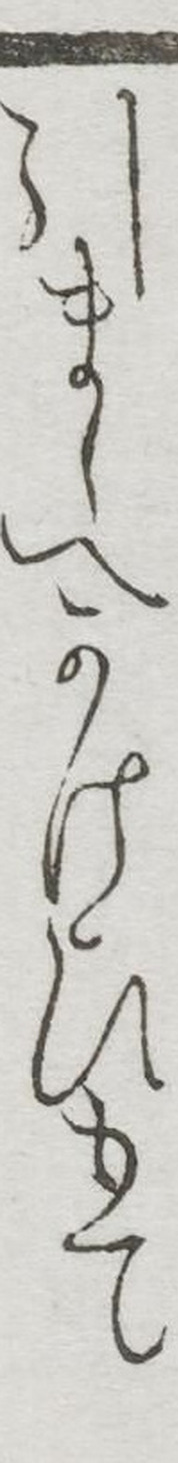引ましへかけひもて
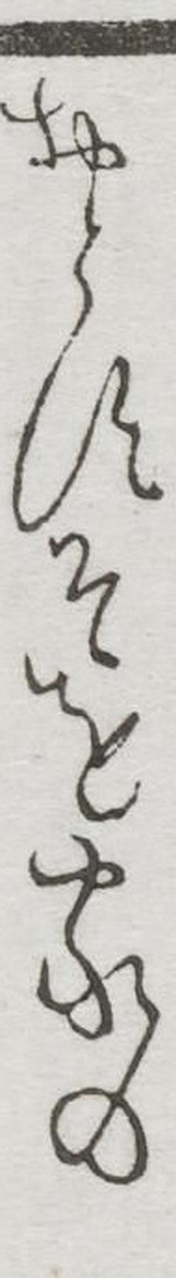おとすそを家の
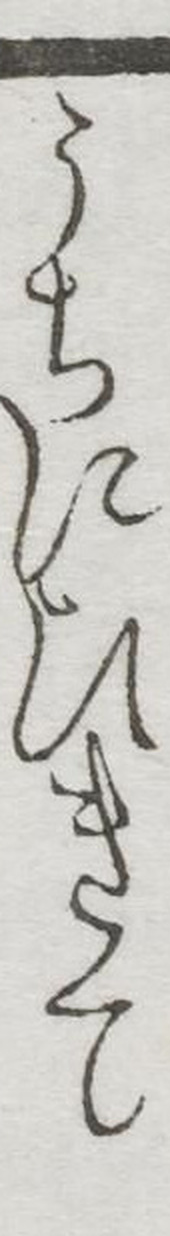うちにひきて
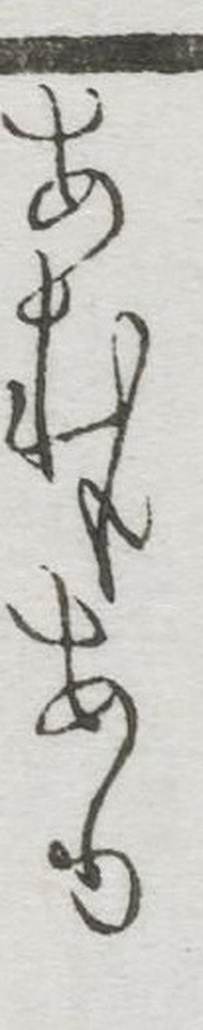あむもあり
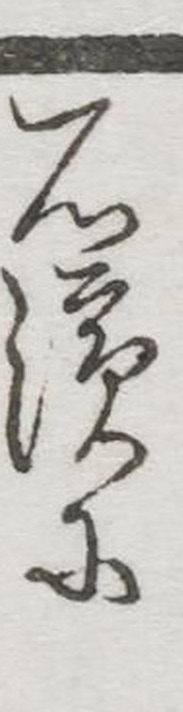石浜に
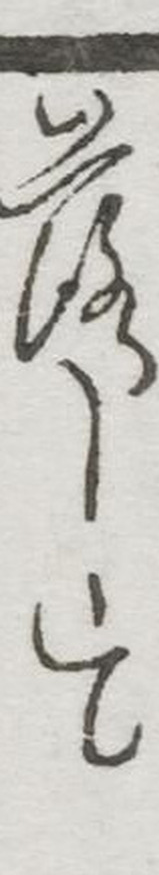落して
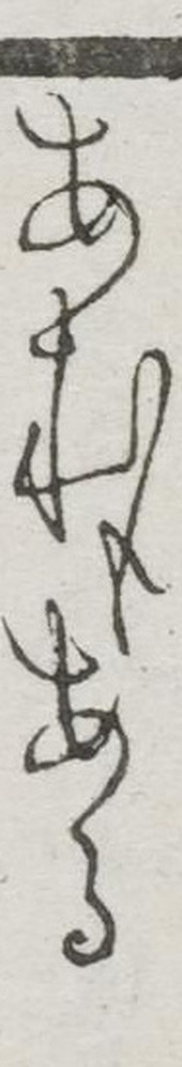あむもある
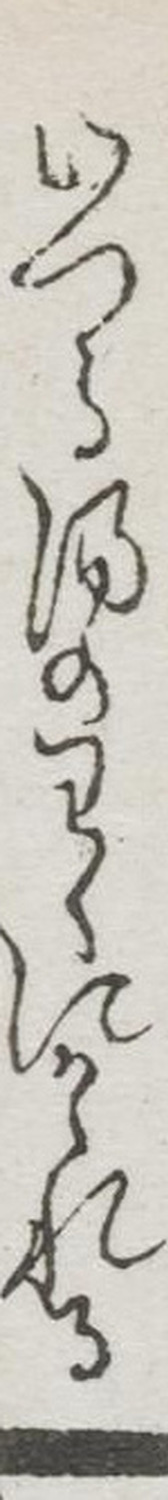いつる湯のわくにかゝれる
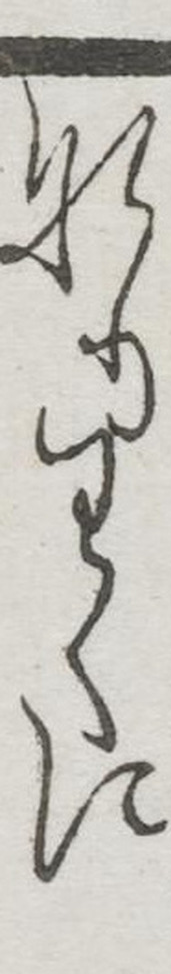なりわくに
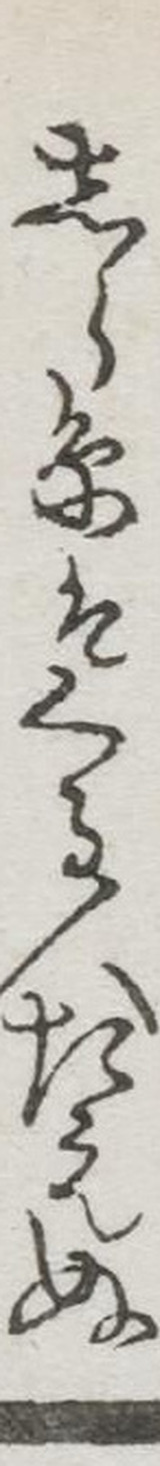しら糸はくる人たえぬ
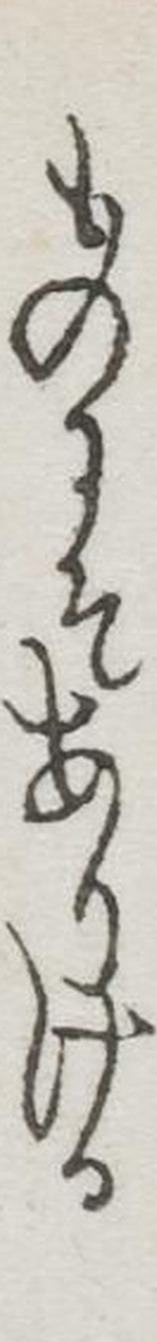ものにてそありける
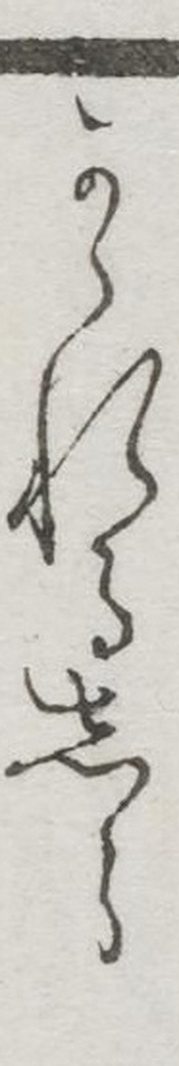かゝれるしら
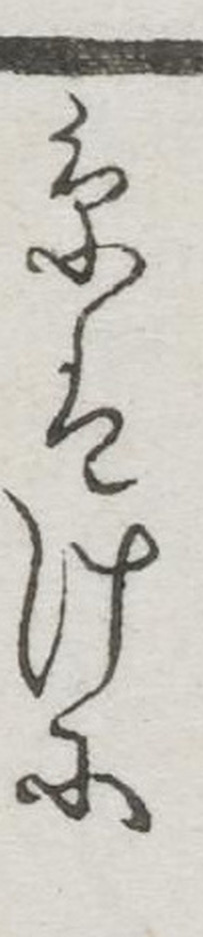糸はけに
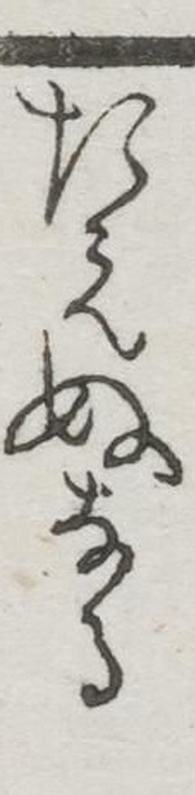たえぬなる
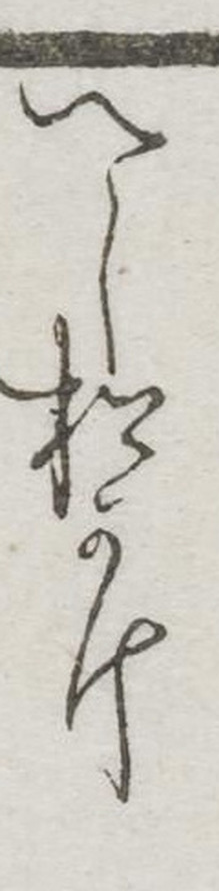へし松かけ
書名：挿画熱海日記　全
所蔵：東京大学地震研究所図書室 Earthquake Research Institute Library, The University of Tokyo, JAPAN
